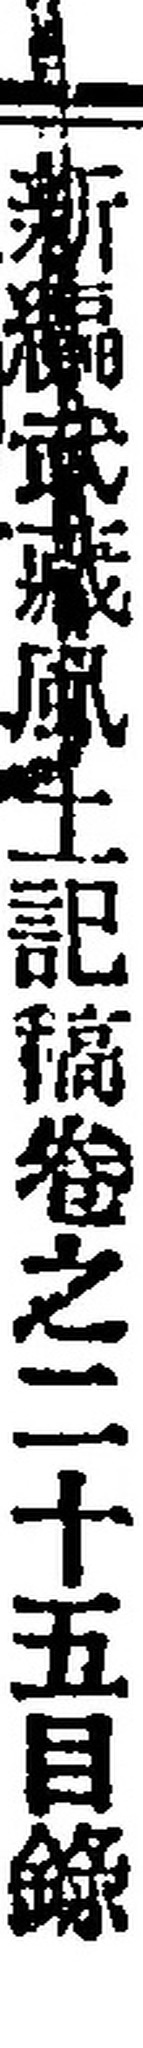新編武蔵風土記稿巻之二十五目録
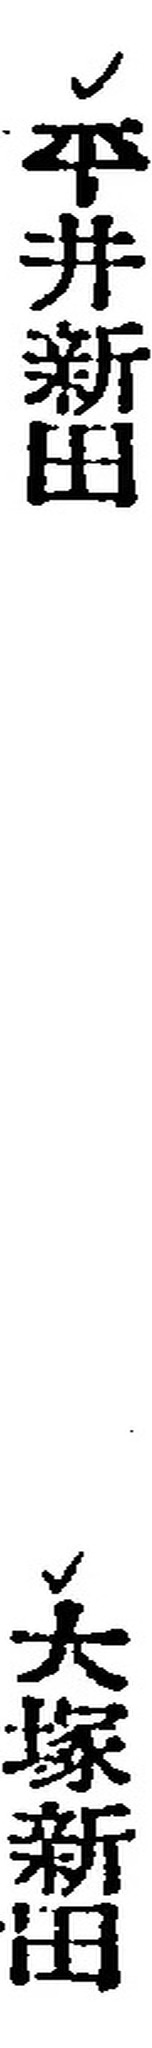平井新田大塚新田
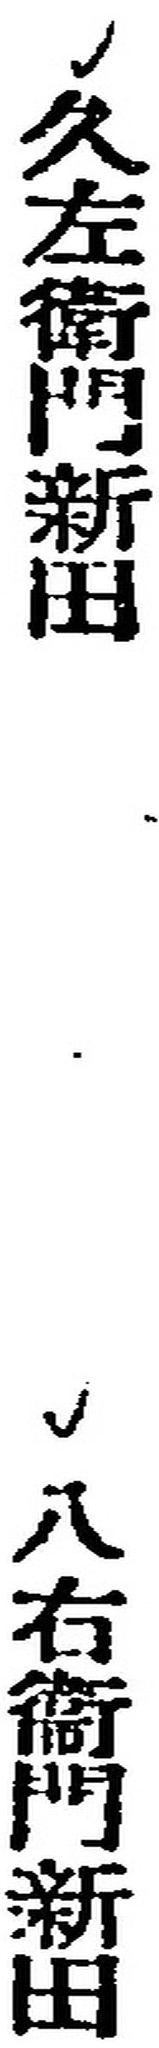久左衛門新田八右衛門新田

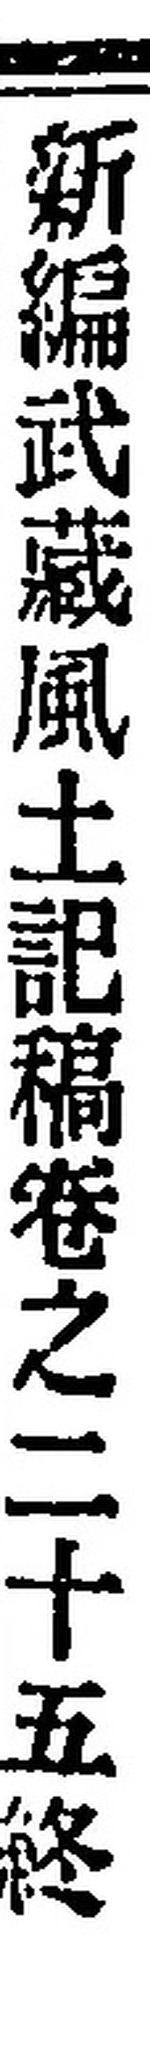新編武藏風土記稿巻之二十五終
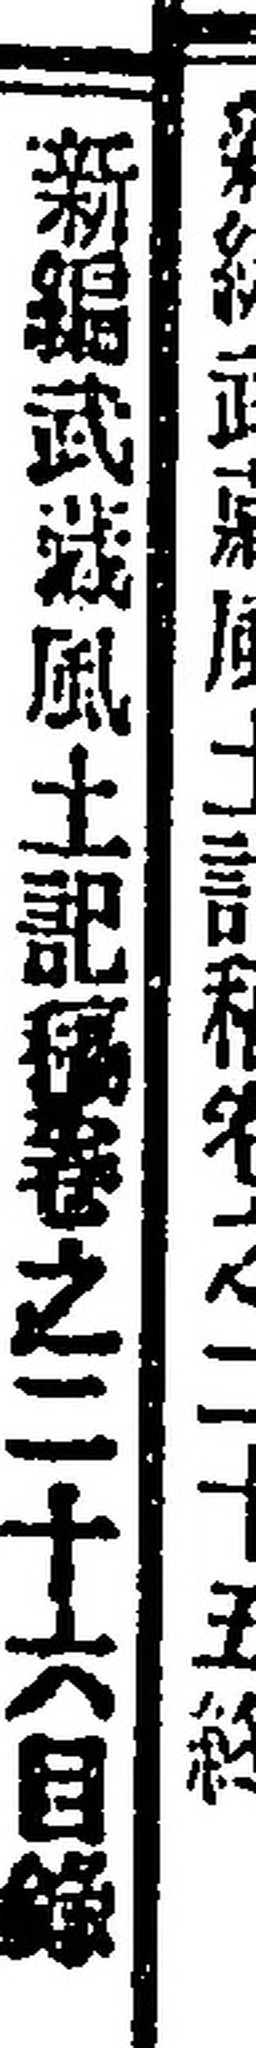新編武蔵風土記稿巻之二十六目録
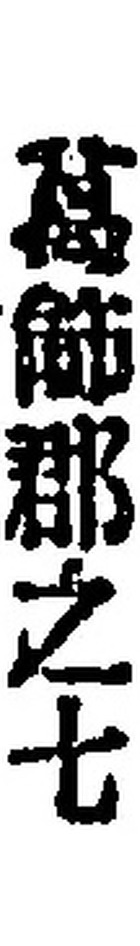葛飾郡之七

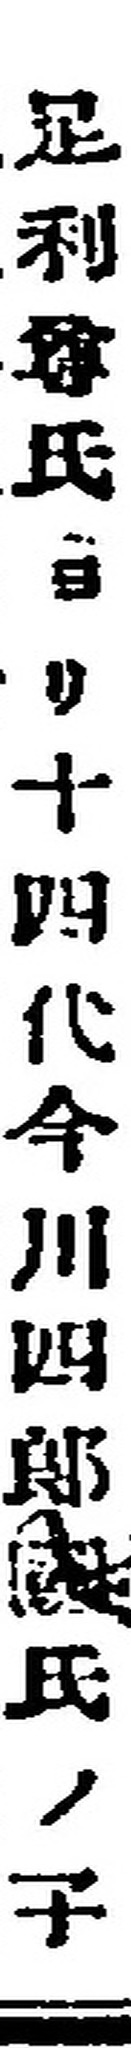足利尊氏より十四代今川四郎国氏の子
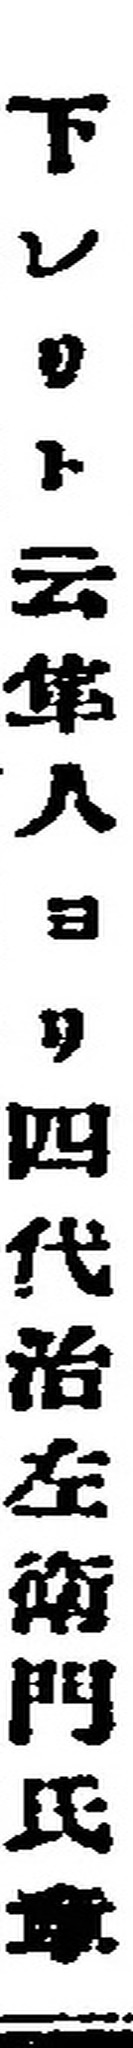下れりと云隼人より四代治左衛門氏章
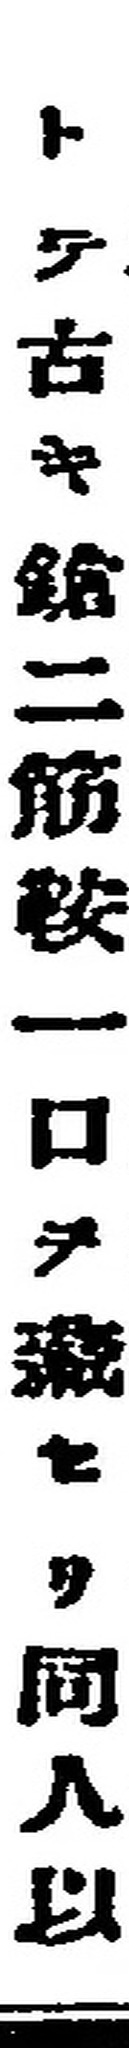とて古き鎗二筋鞍一口を蔵せり同人以
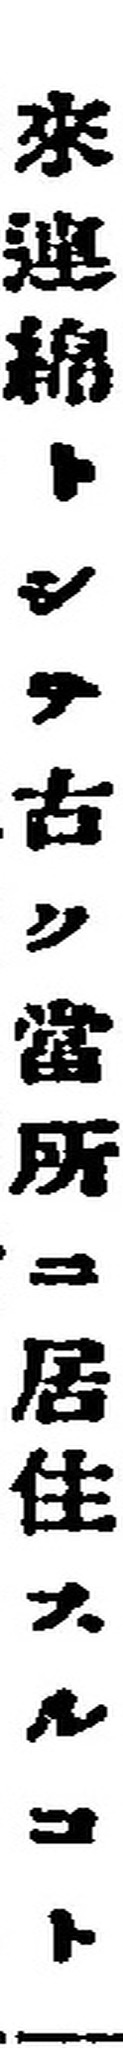来連綿として古く当所に居住すること
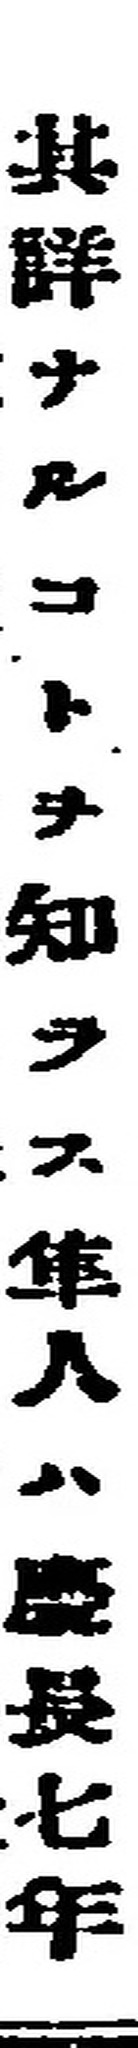其詳なることを知らす隼人は慶長七年
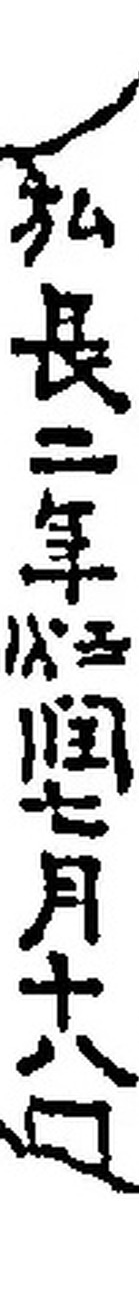弘長二年壬戌閏七月十八
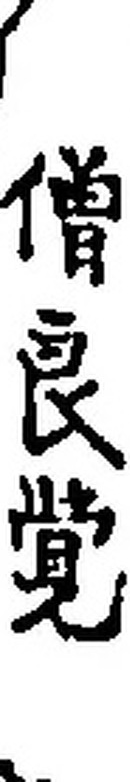僧良覚
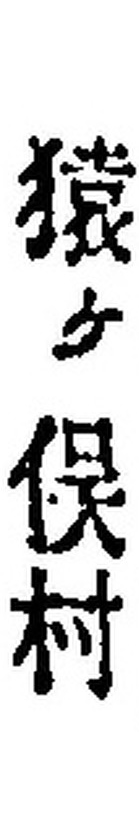猿ヶ俣村
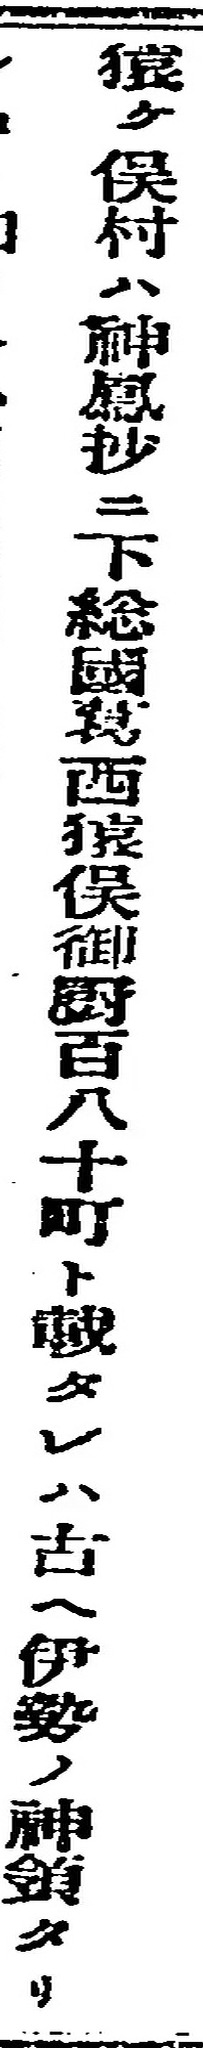猿ヶ俣村は神鳳抄に下総国葛飾猿俣御厨百八十町と載たれは古へ伊勢の神領たり
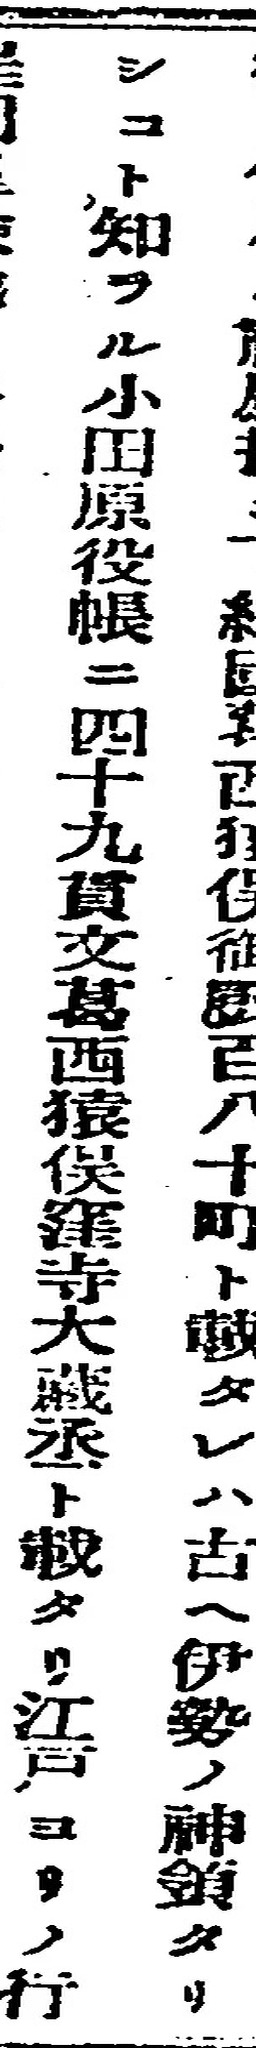しこと知らる小田原役帳に四十九賃文葛西猿俣窪寺大蔵丞と載たり江戸よりの行
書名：新編武蔵風土記稿　葛飾郡之６〜１２
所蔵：国立国会図書館 National Diet Library, JAPAN
